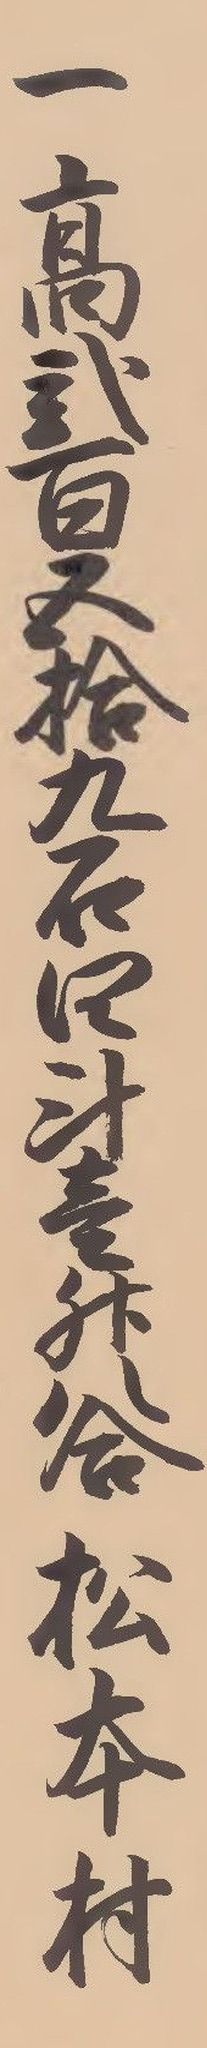一髙弐百五拾九石四斗壱升八合松本村
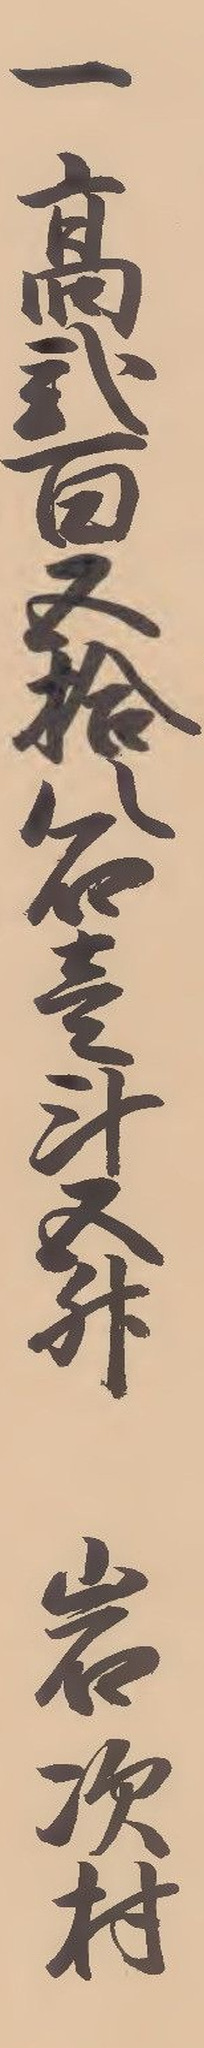一髙弐百五拾八石壱斗五升岩次村

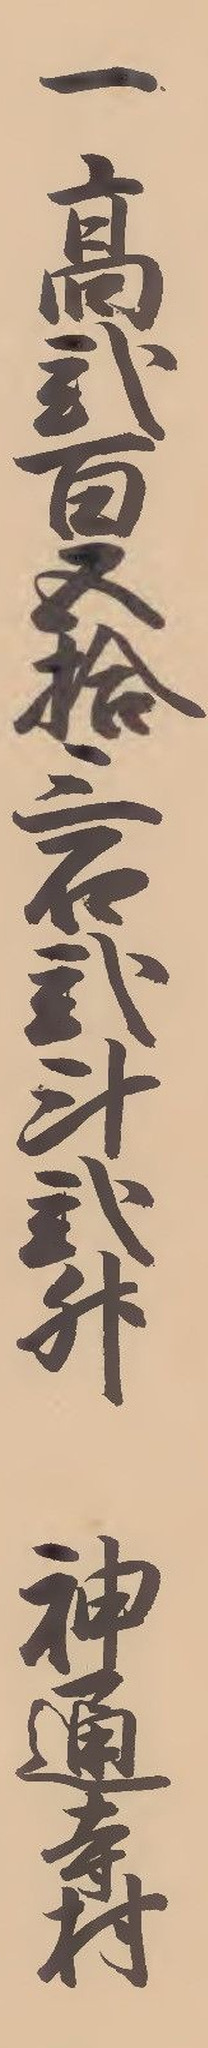一髙弐百五拾三石弐斗弐升神通寺村
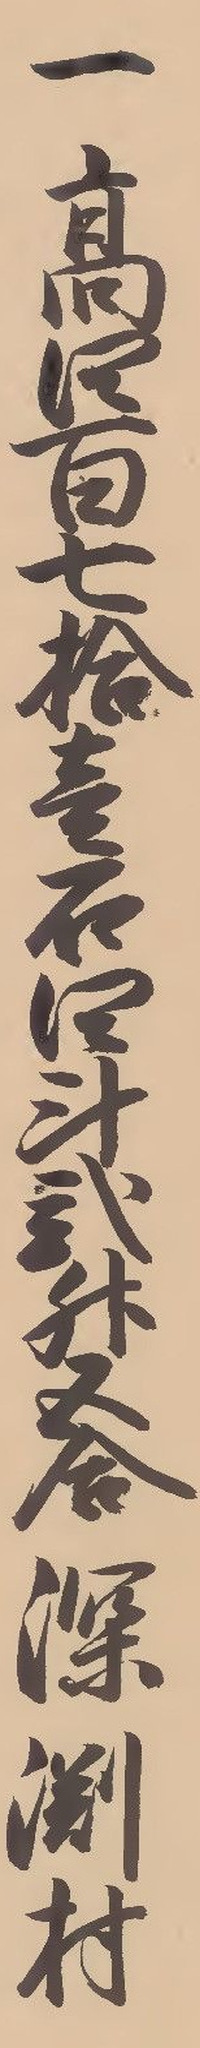一髙四百七拾壱石四斗弐升五合深渕村
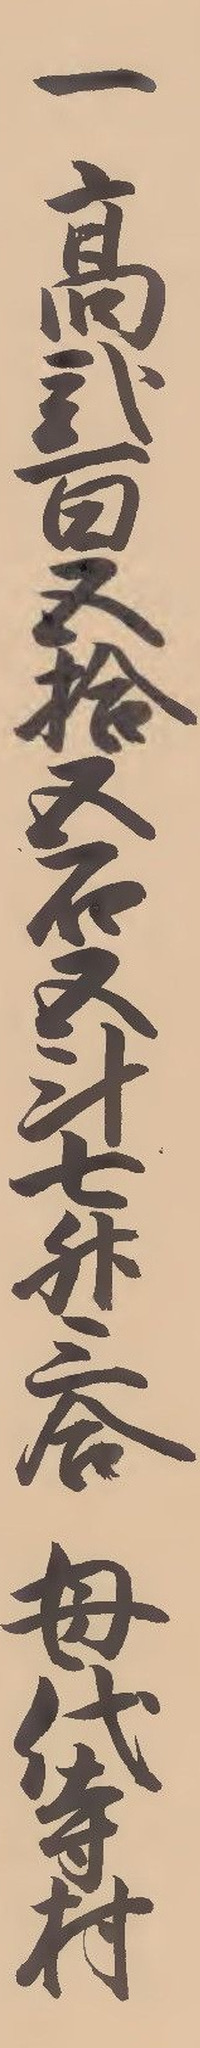一髙弐百五拾五石五斗七升三合母代寺村
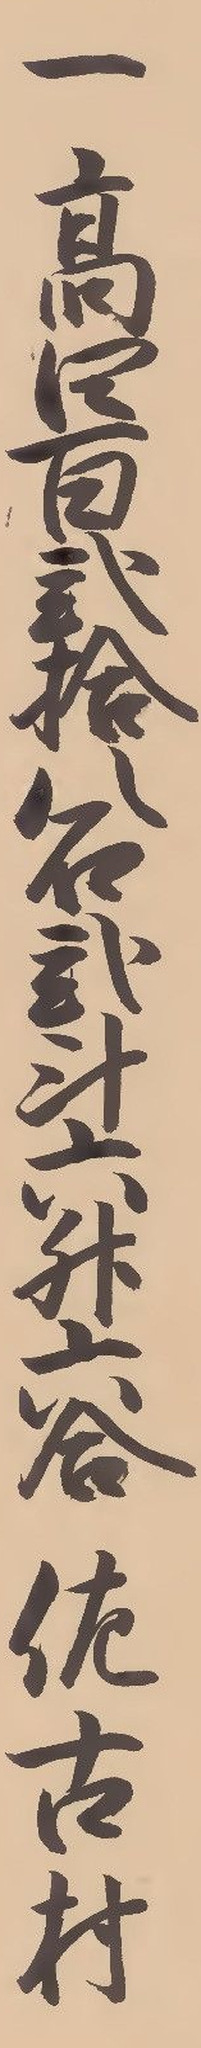一髙四百弐拾八石弐斗六升六合佐古村
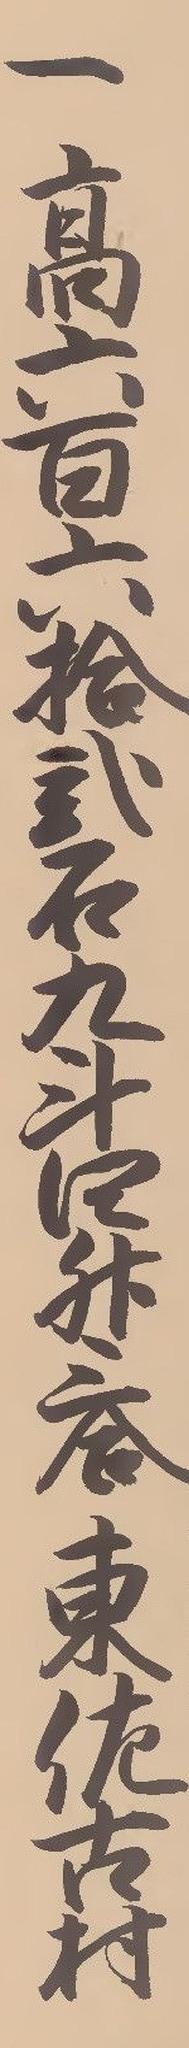一髙六百六拾弐石九斗四升三合東佐古村
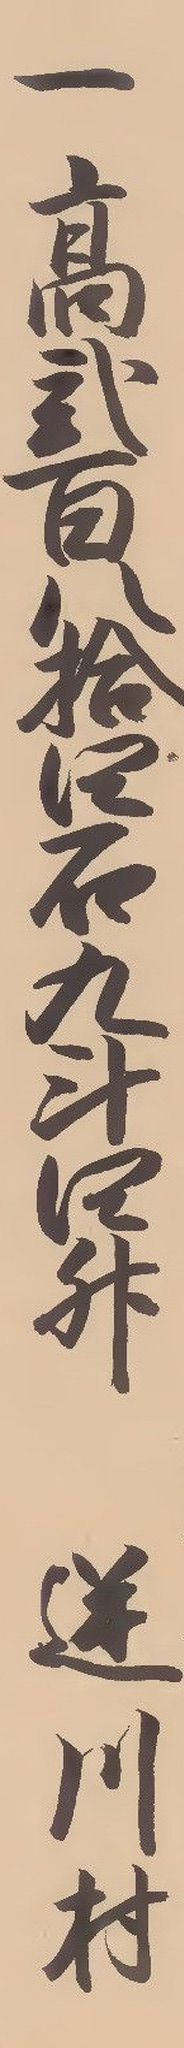一髙弐百八拾四石九斗四升逆川村
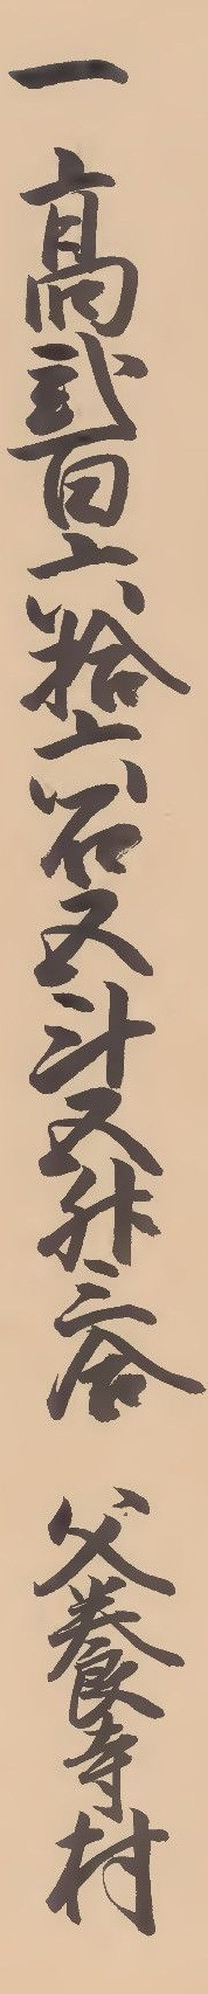一髙弐百六拾六石五斗五升三合父養寺村
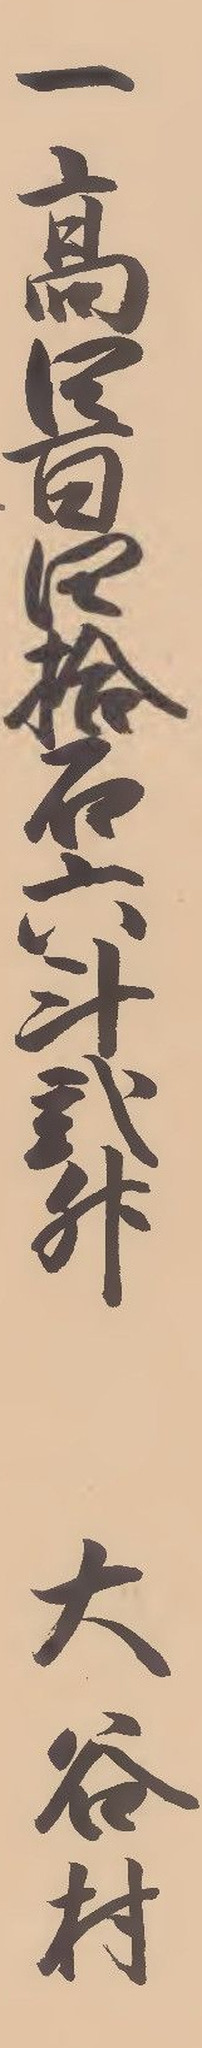一髙四百四拾石六斗弐升大谷村

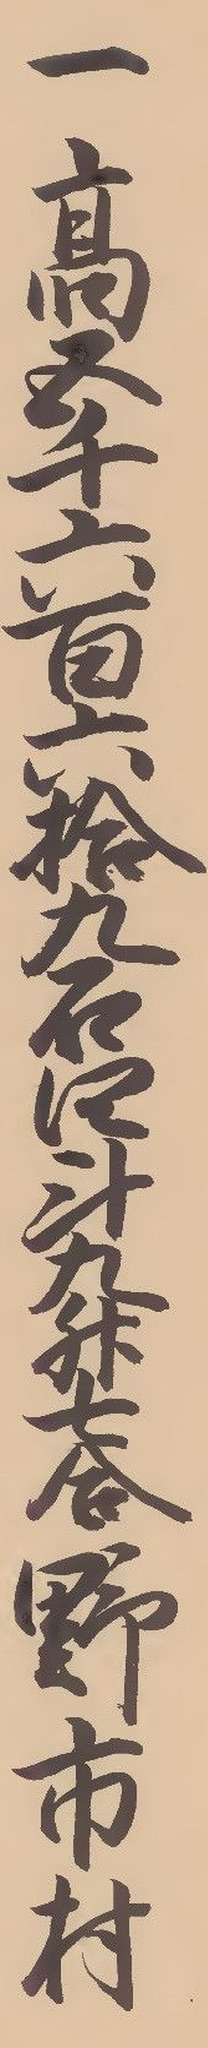一髙五千六百六拾九石四斗九升七合野市村
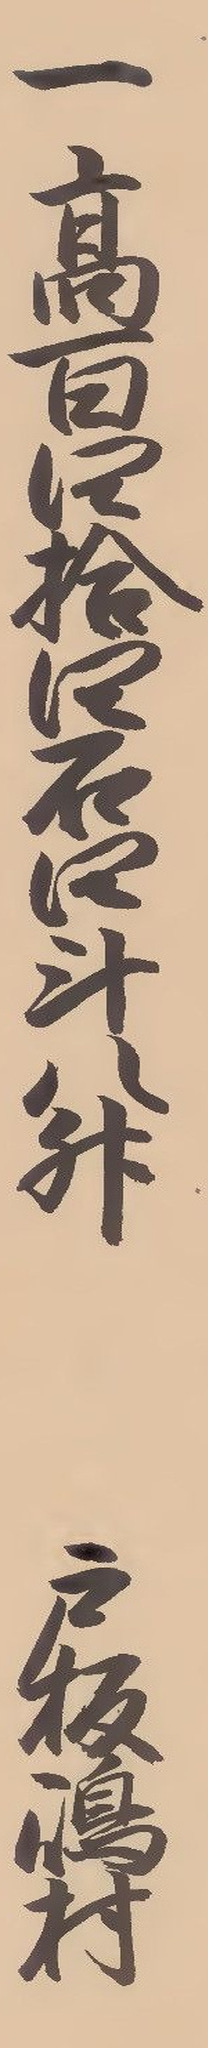一髙百四拾四石四斗八升戸板嶋村
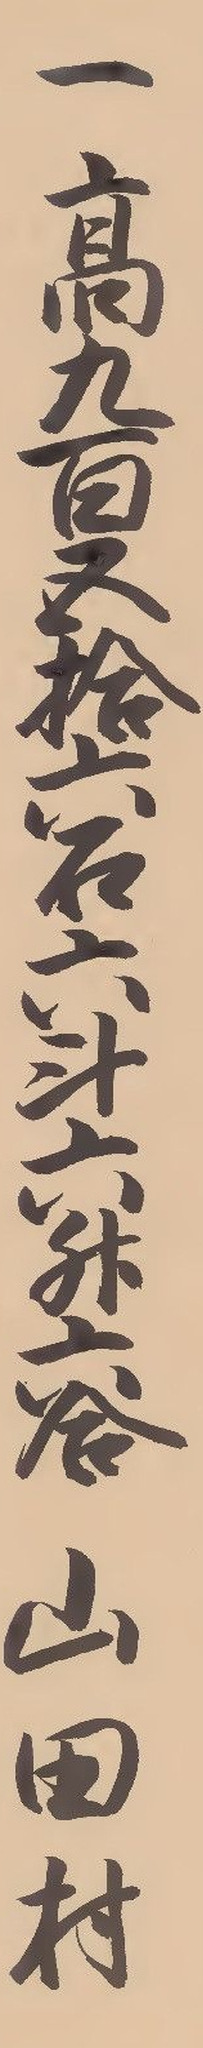一髙九百五拾六石六斗六升六合山田村
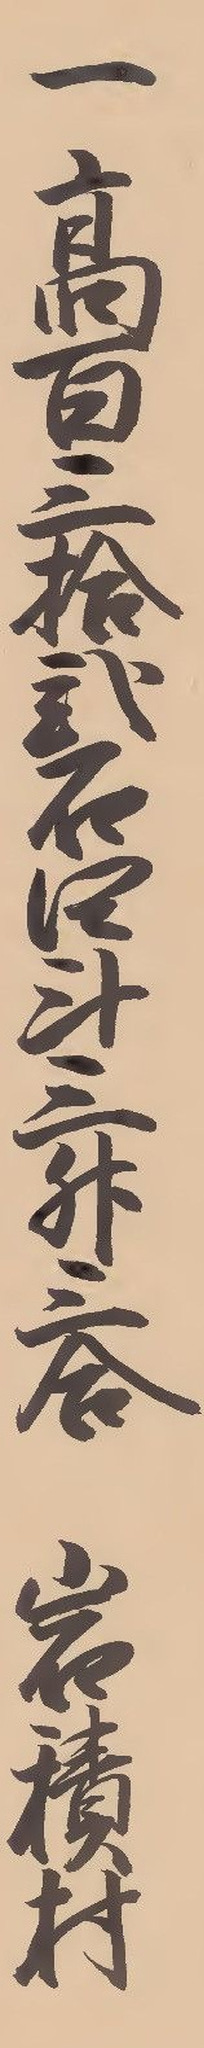一髙百三拾弐石四斗三升三合岩積村
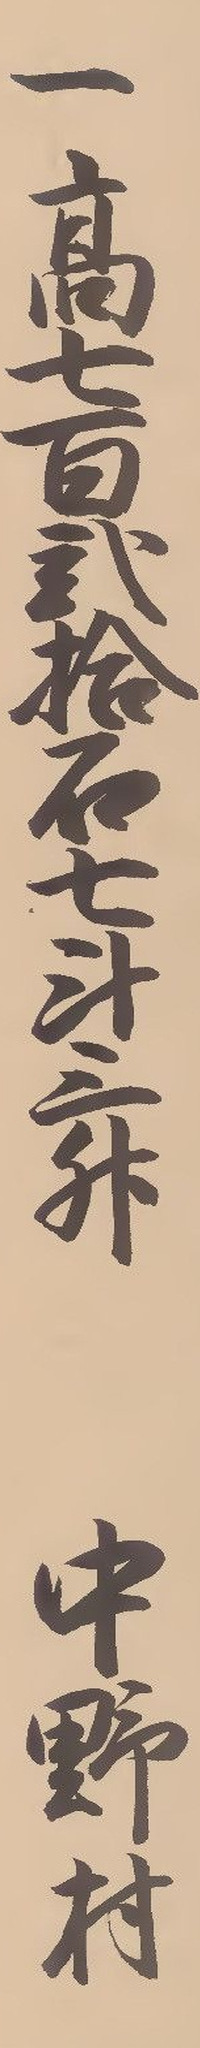一髙七百弐拾石七斗三升中野村
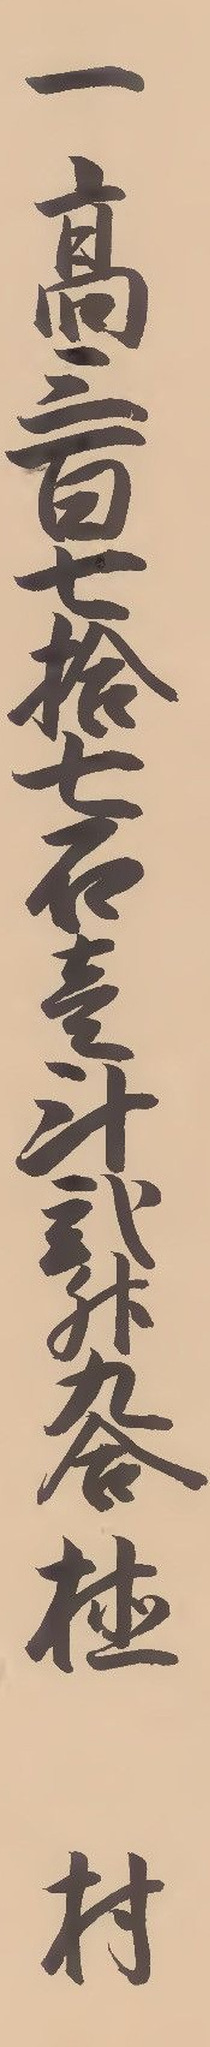一髙三百七拾七石壱斗弐升九合植村
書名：土佐国郷帳
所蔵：国立公文書館 National Archives of Japan
